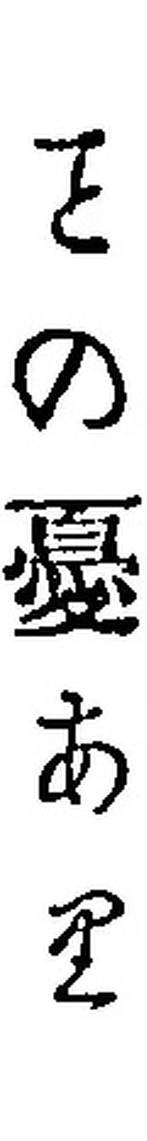ことの憂あり

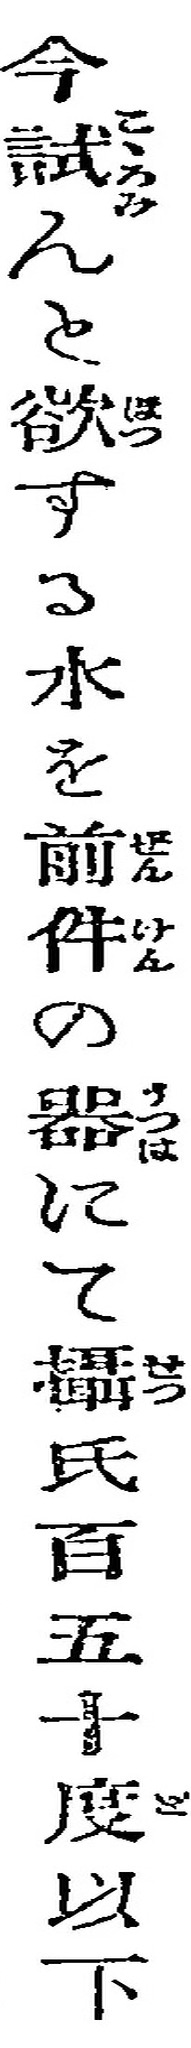今試んと欲する水を前件の器にて摂氏百五十度以下
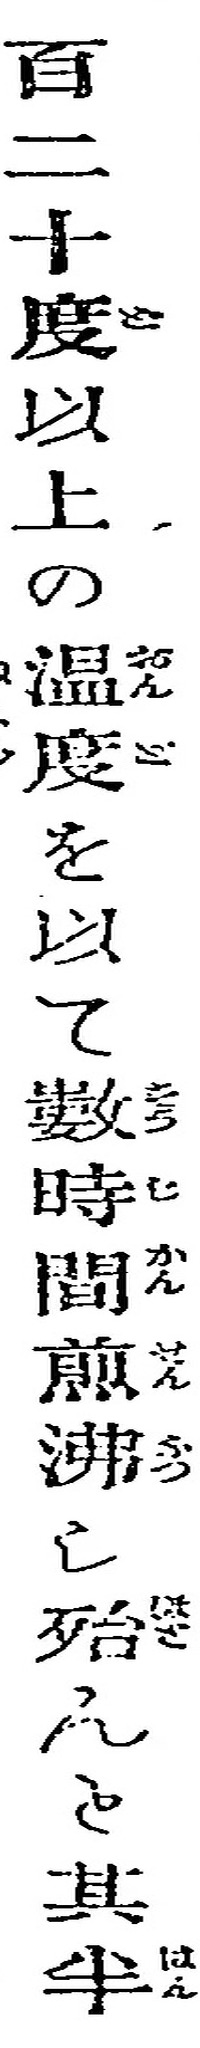百二十度の温度を以て数時間煎沸し殆んと其半
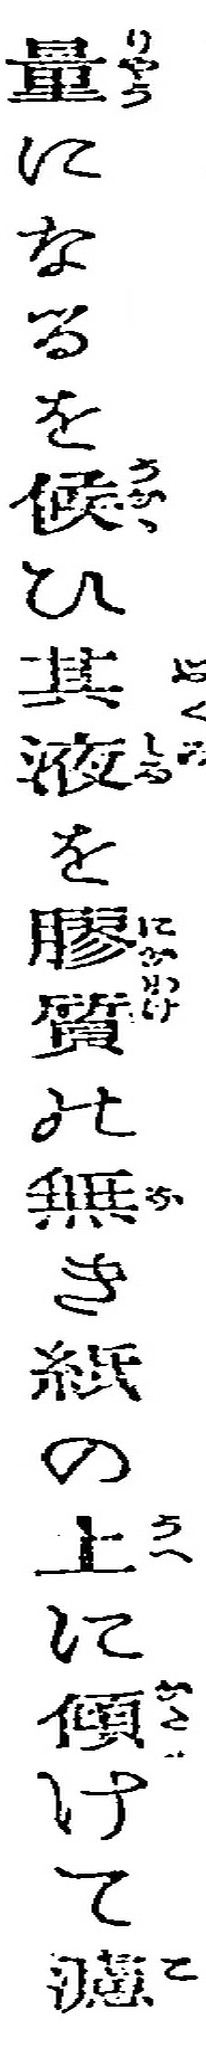量になると候ひ其液を膠質の無き紙の上に傾けて濾
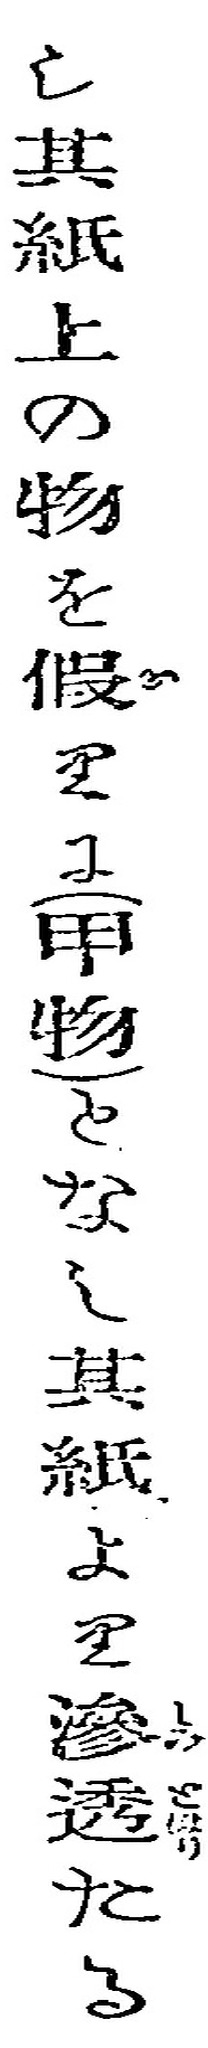し其紙上の物を假りに[甲物]となし其紙より滲透たる
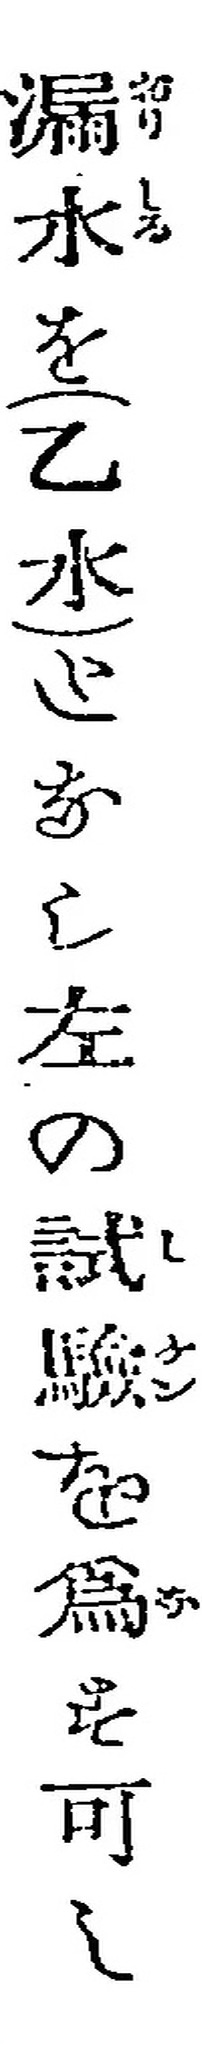漏水を[乙水]となし左の試験を為す可し
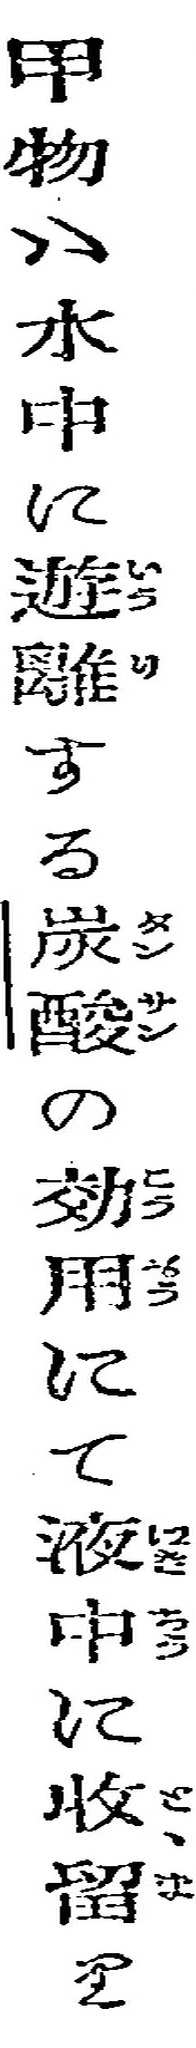甲物は水中に遊離する炭酸の効用にて液中に収留り
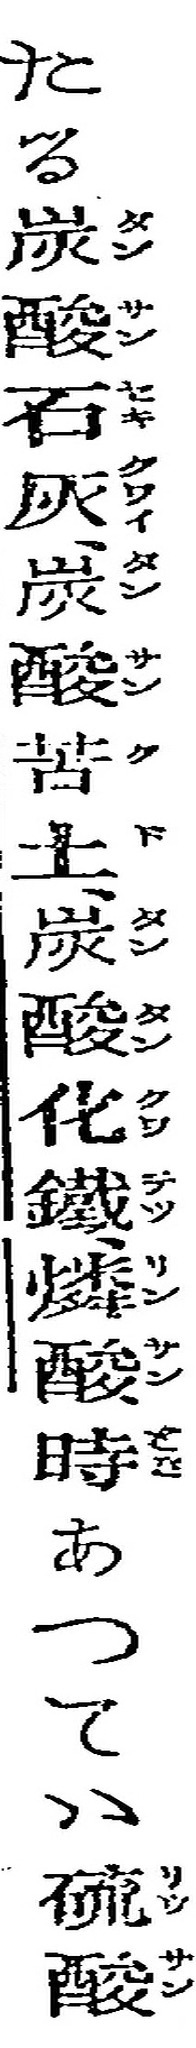たる炭酸石灰、炭酸苦土、膽酸化鐵、燐酸時あつては硫酸
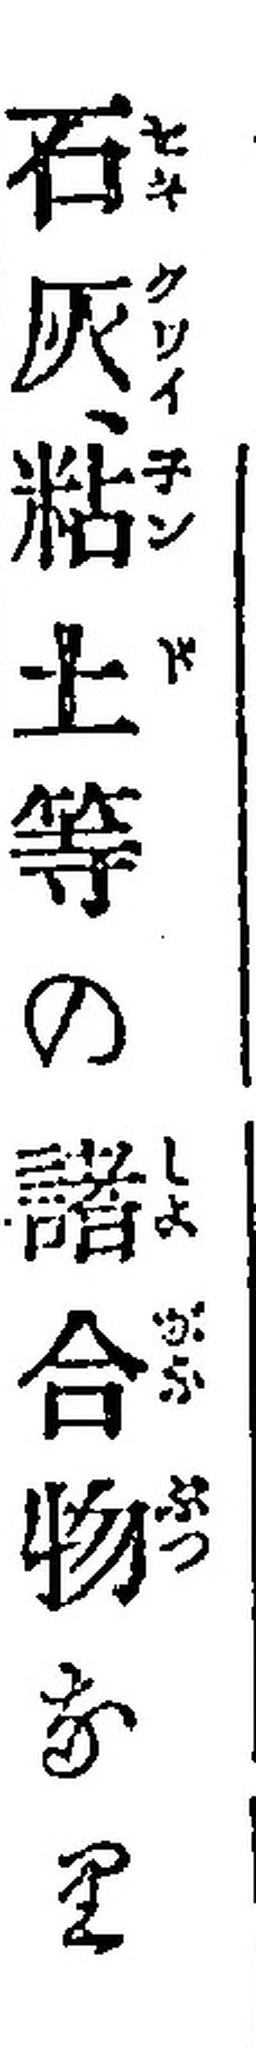石灰、粘土等の諸合物なり
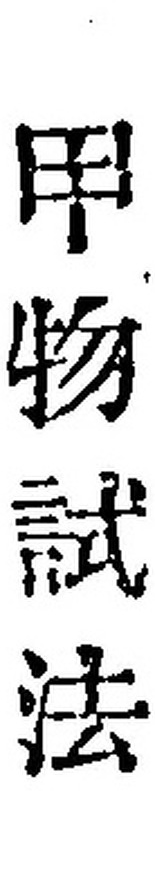甲物試法
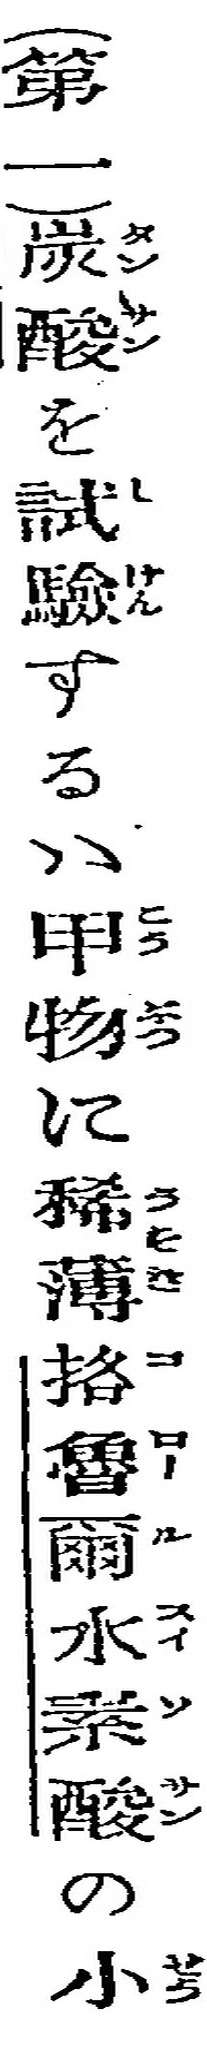[第一]炭酸を試験するは甲物に稀薄挌魯爾水素の小
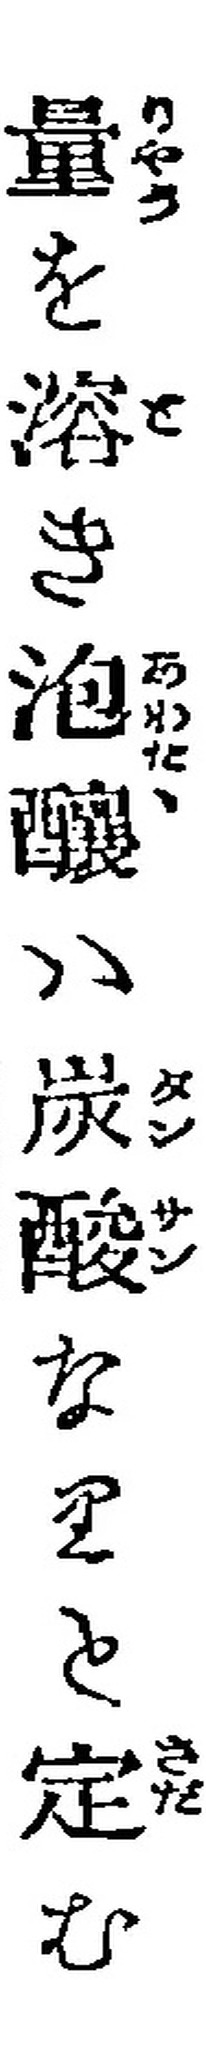量を溶き泡醸は炭酸なりと定む
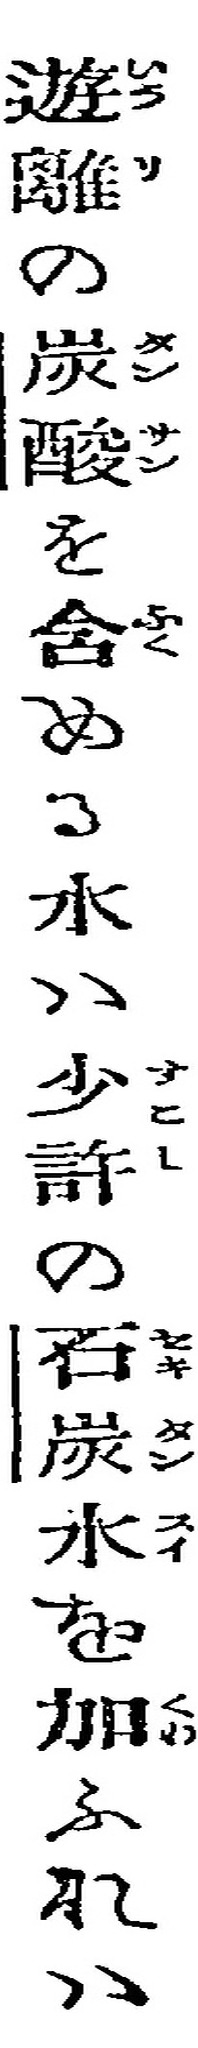遊離の炭酸を含める水は少許の石炭水を加ふれは
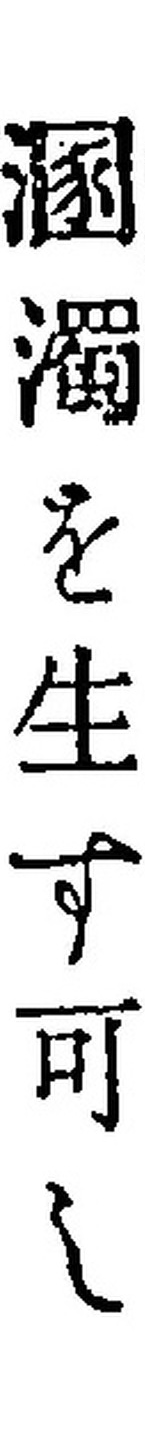溷濁を生す可し
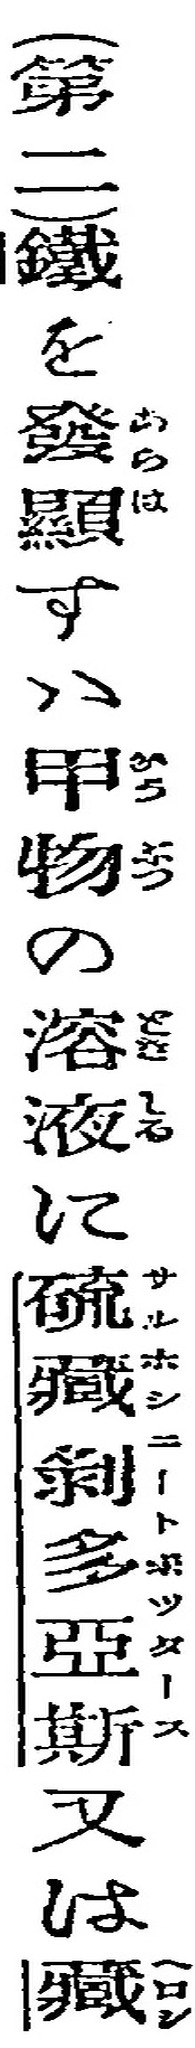[第二]鐵を發顕すは甲物の溶液に硫藏剥多亞斯又は蔵
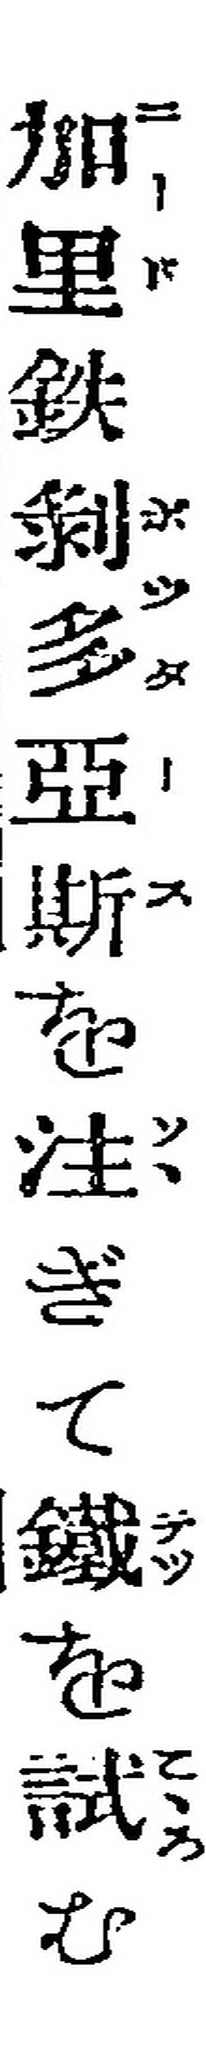加里鉄剥多亞斯を注ぎて鐵を試む
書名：飲水の心得 : 伝染病の予防
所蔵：国立国会図書館 National Diet Library, JAPAN
